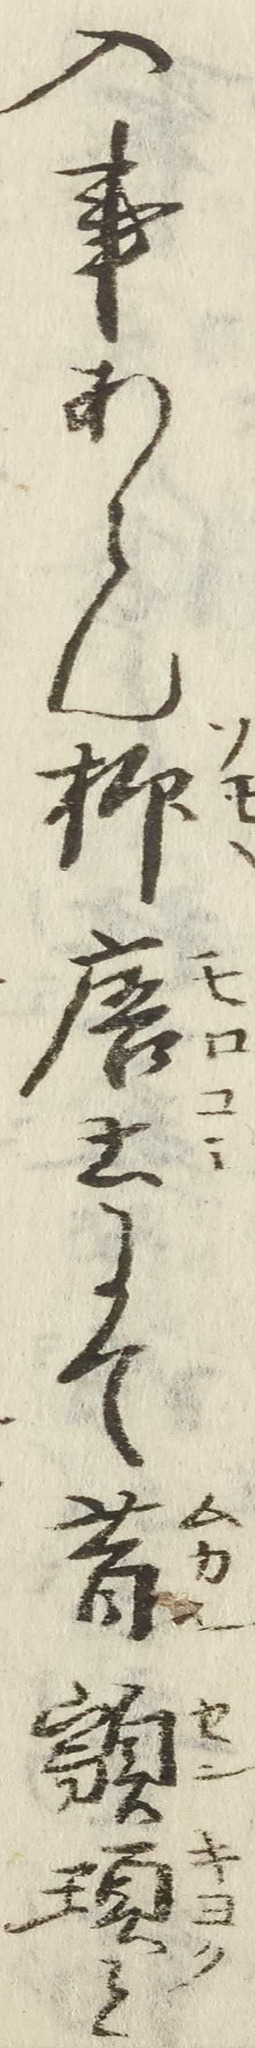入事あらん抑唐土にて昔顓頊と
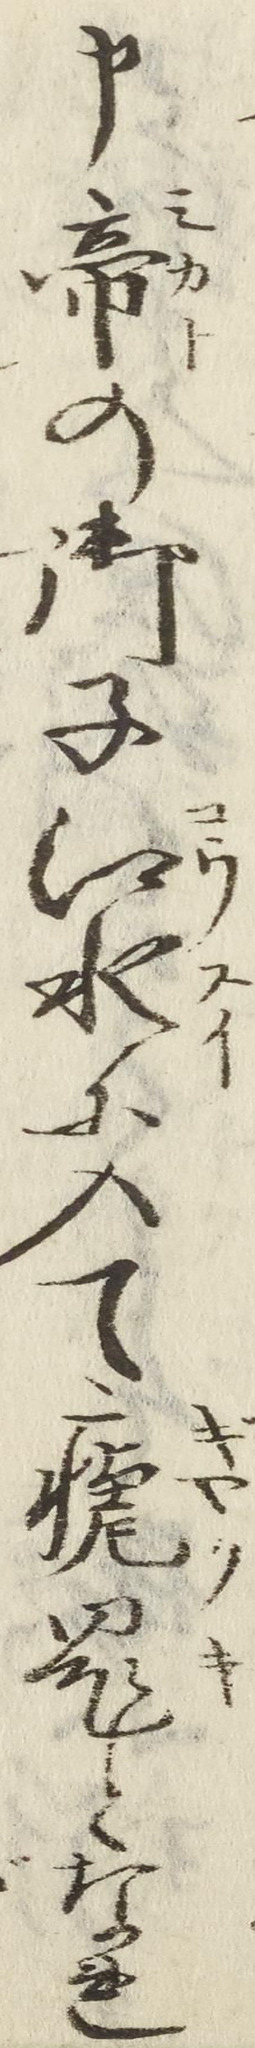申帝の御子江水に入て瘧鬼となれ
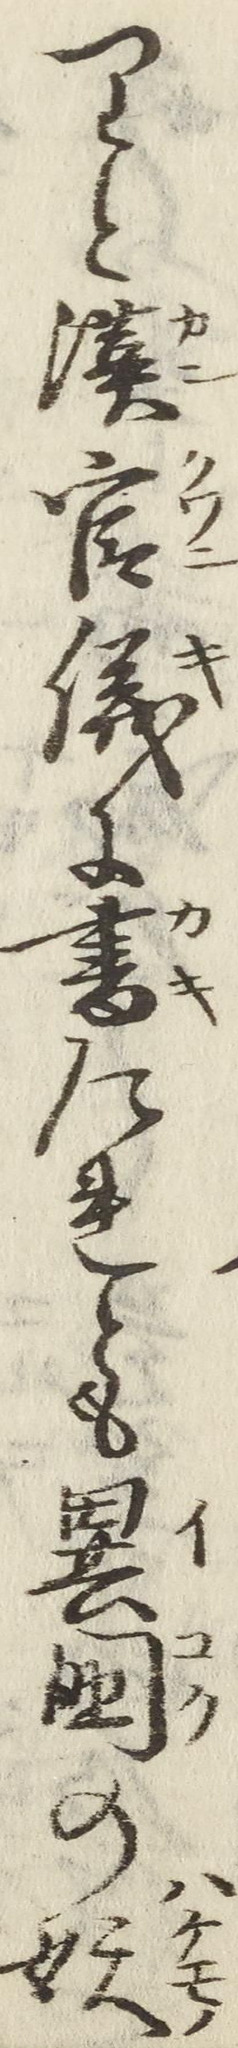りと漢官儀に書たれとも異国の妖
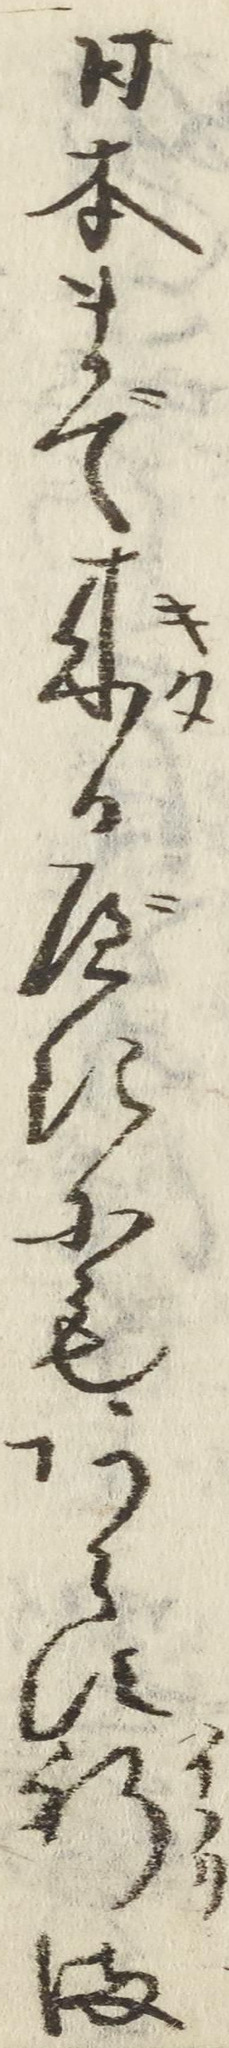日本まで来るべきにもあらす祈ま
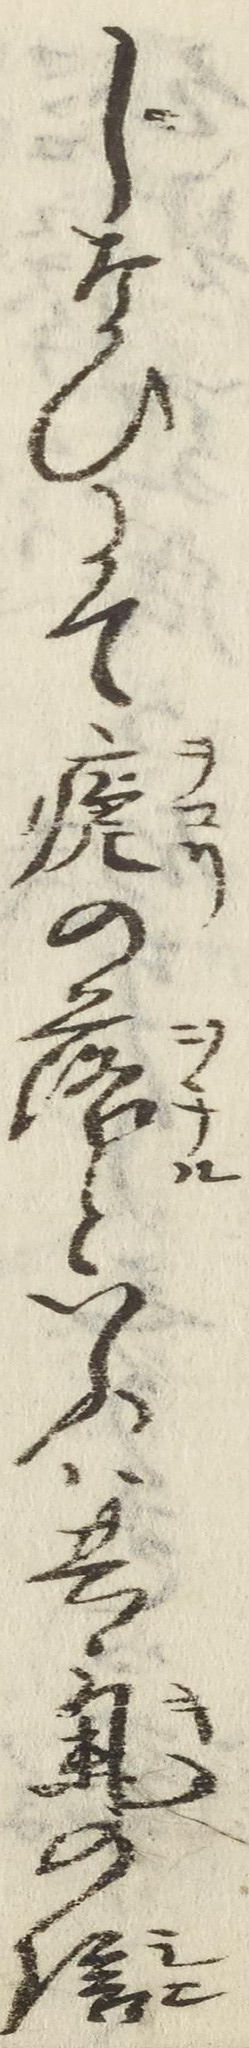じなひにて瘧の落といふは其気の信
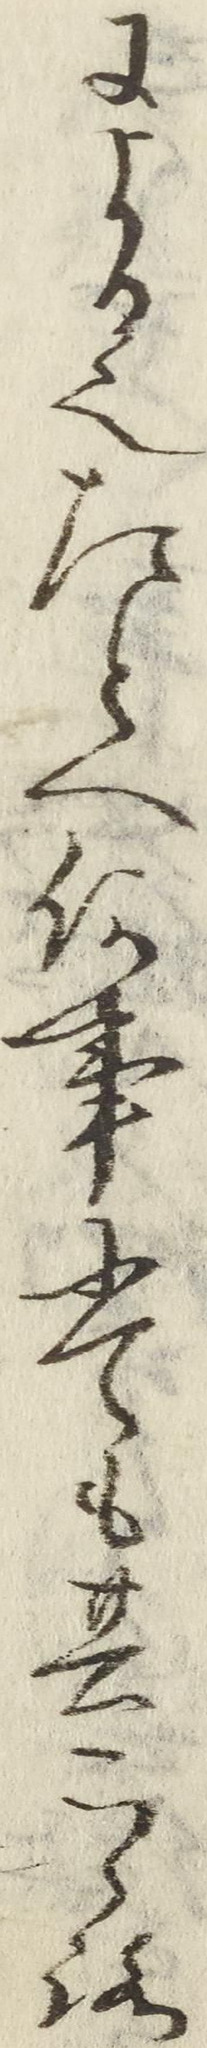による也たとへ何事にても其こゝろ
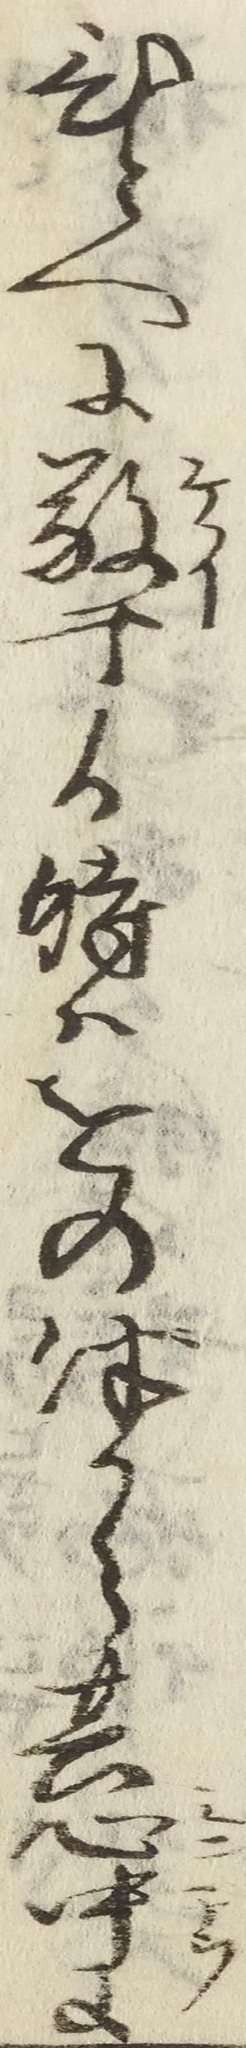ひとへに敬する時はをのづから其心中に

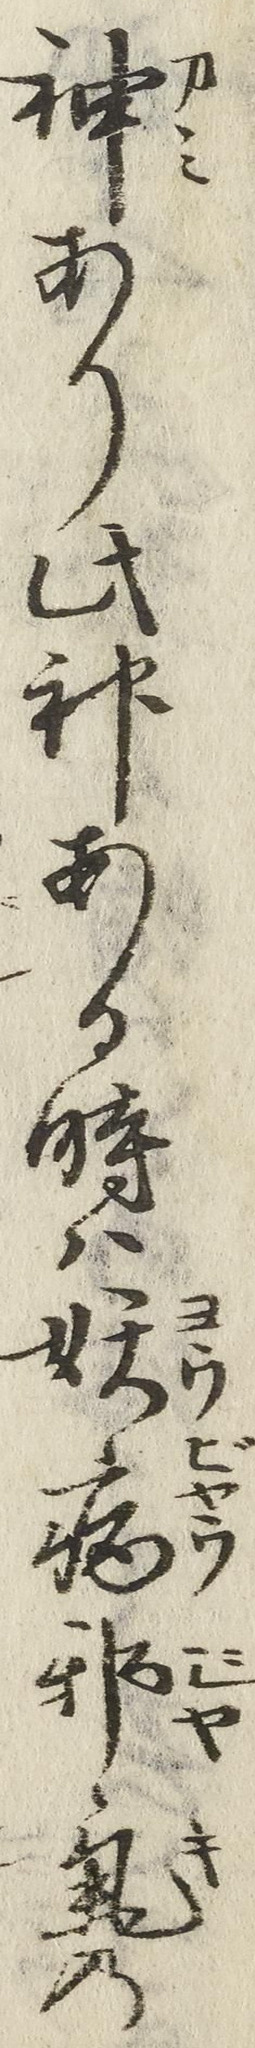神あり此神ある時は妖病邪気の
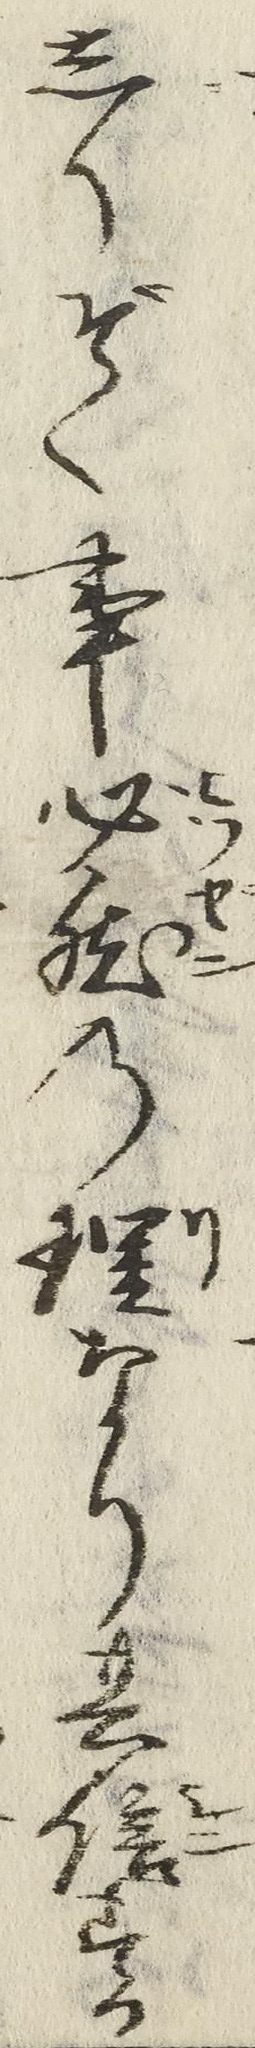しりぞく事必然の理なり其信する
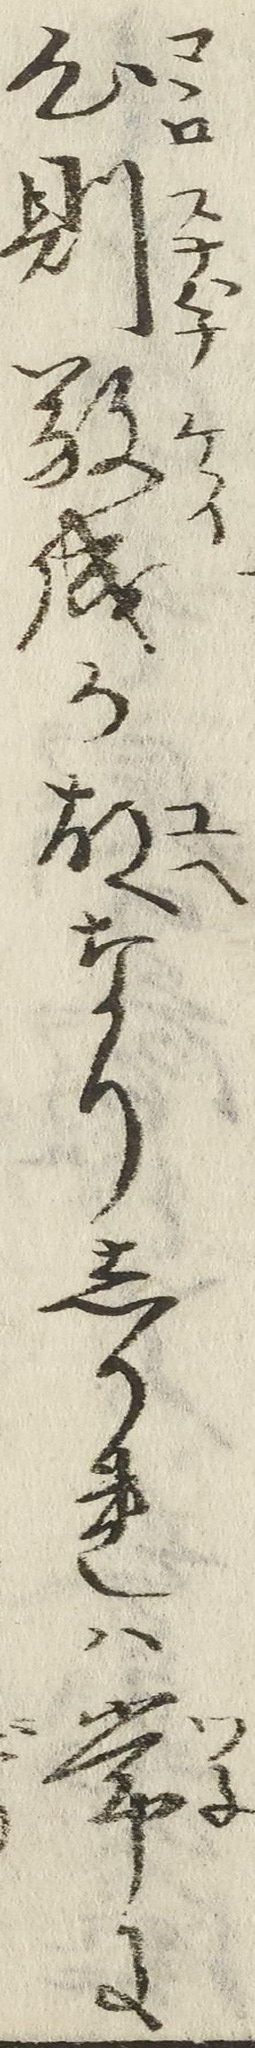心則敬成か故なりしかれは常に
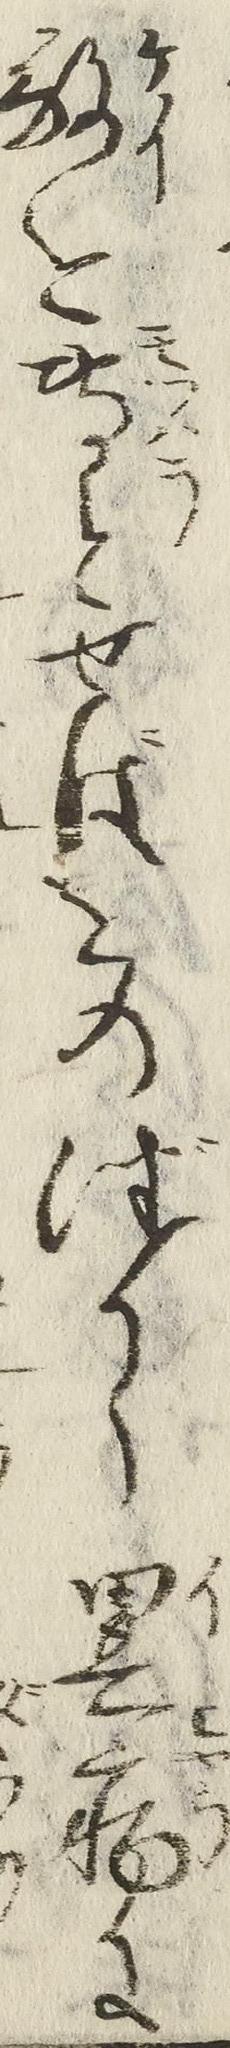敬を専とせばをのづから異病に
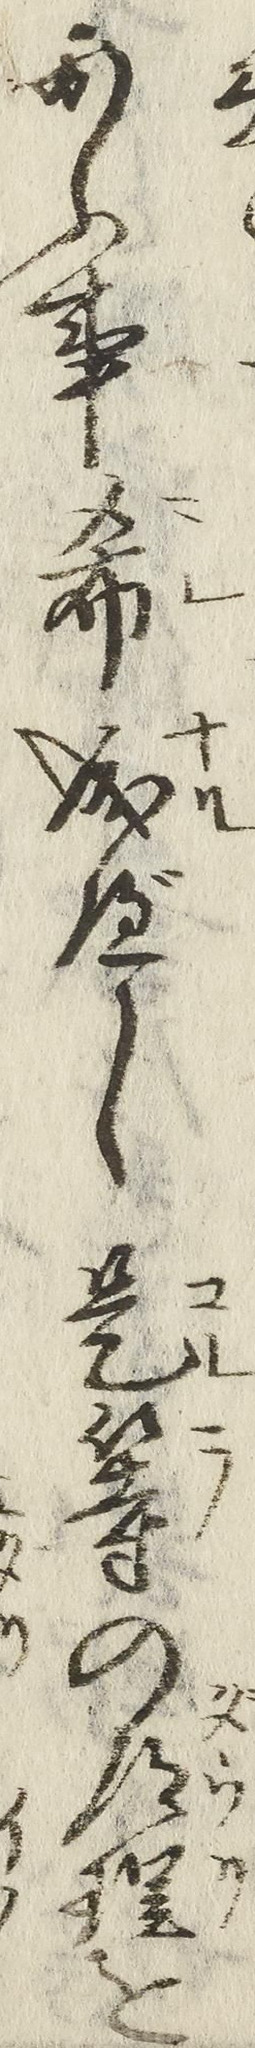あふ事希成べし是等の道理を
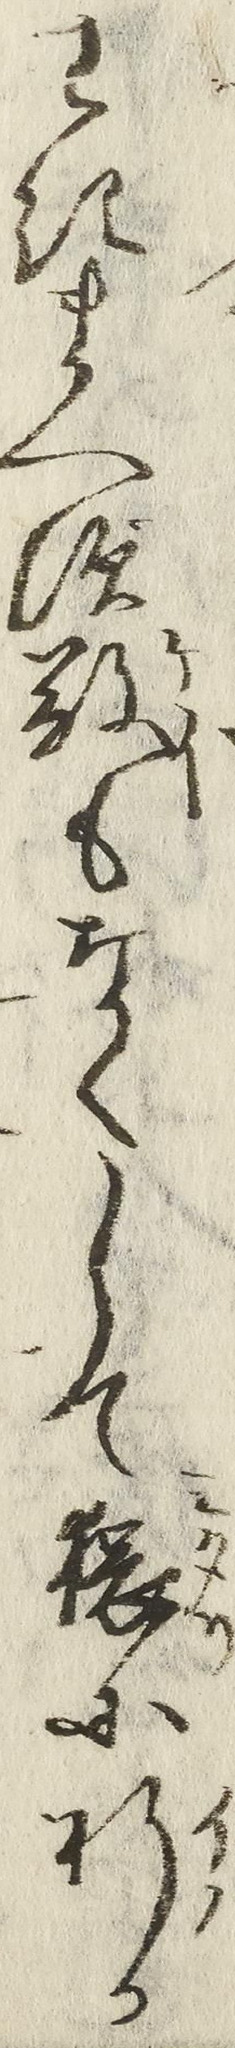わきまへず敬もなくして猥に祈る
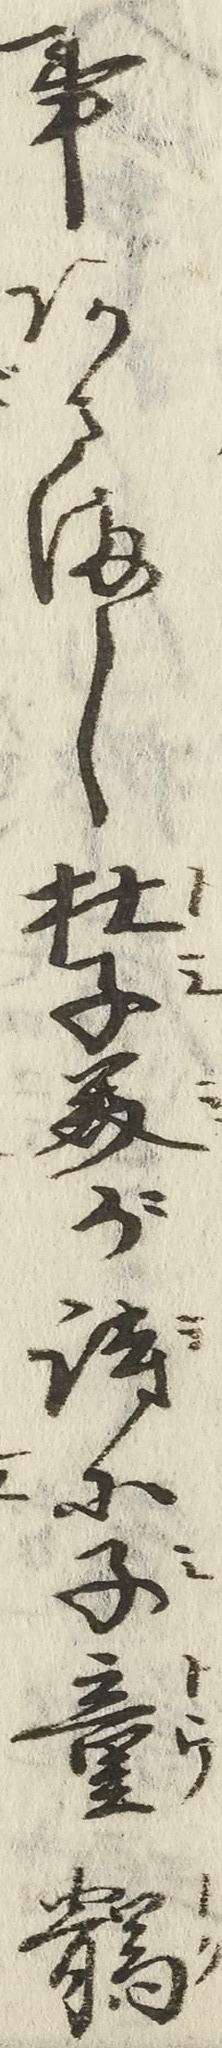事あるまし杜子美が詩に子童髑
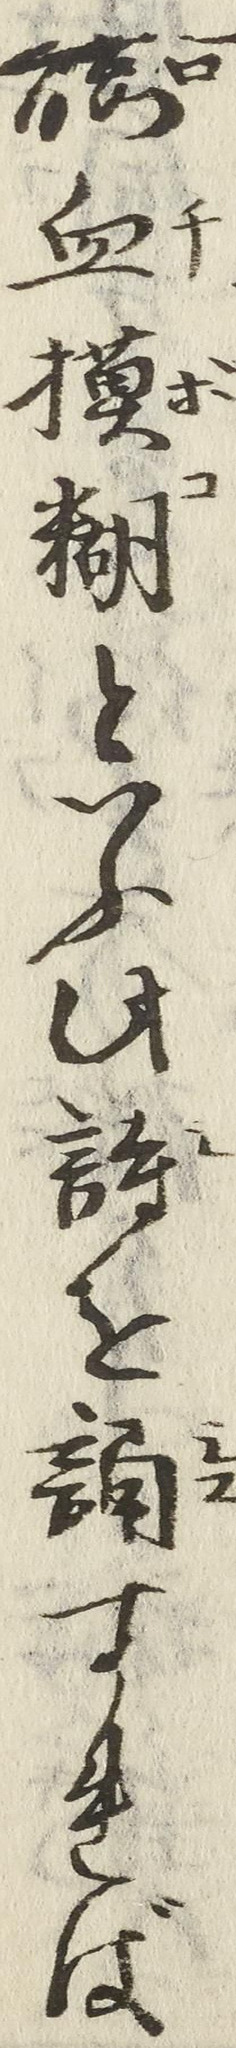髏血模湖といふ此詩を誦すれば
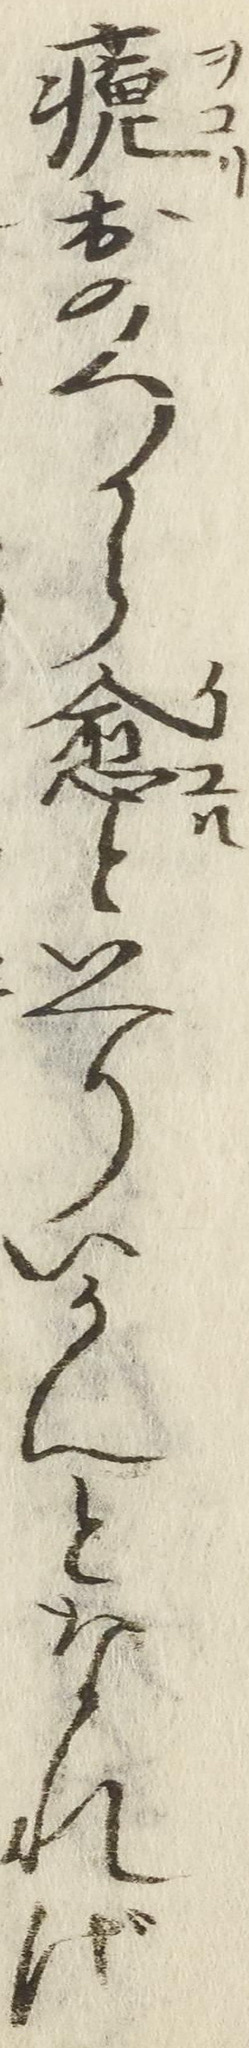瘧おのつから愈といへりいかんとなれば
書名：天地或問珍　地
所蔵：東京大学地震研究所図書室 Earthquake Research Institute Library, The University of Tokyo, JAPAN
